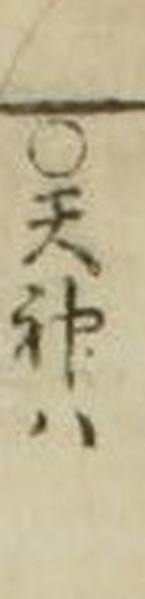〇天神は
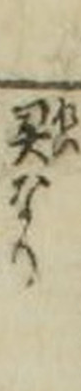霊なり
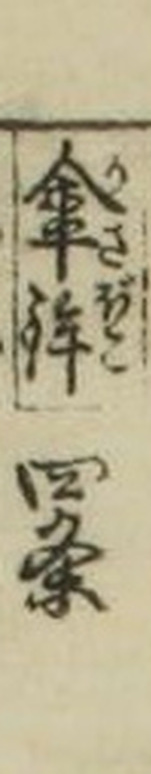傘鉾四条
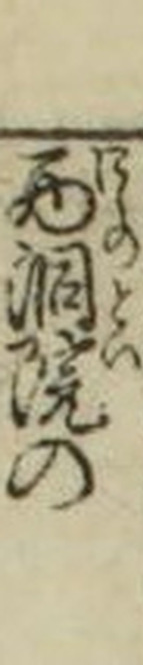西洞院の
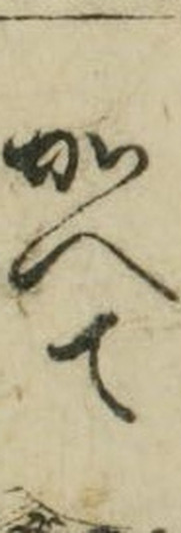かへて
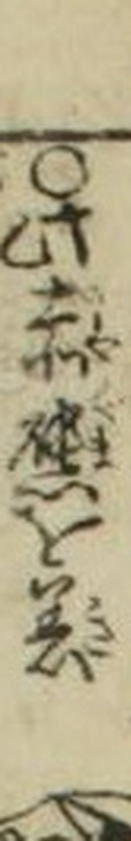〇此赤熊を着
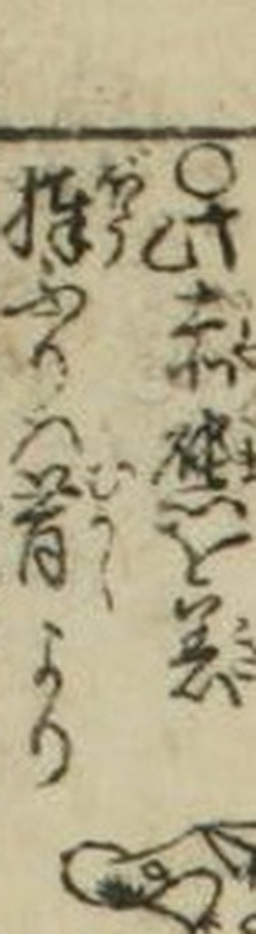棒ふりは昔より
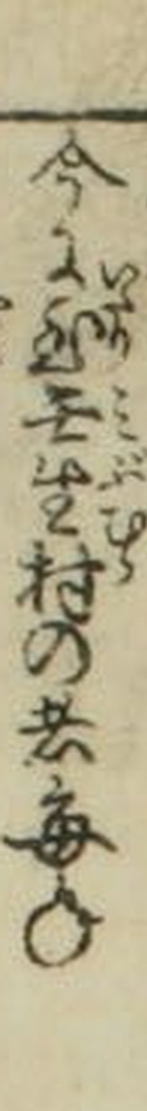今に至壬生村の者毎年
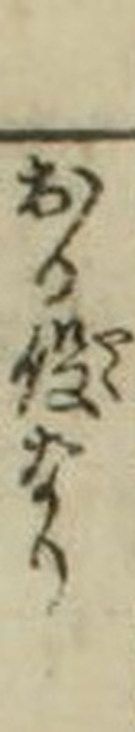出る役なり
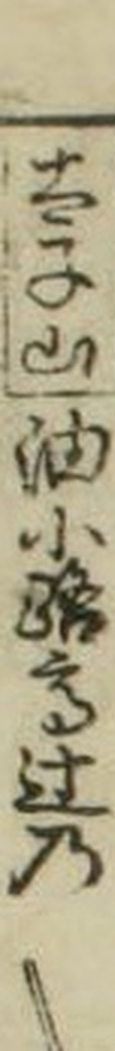太子山油小路高辻の
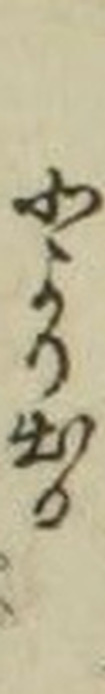南より出る
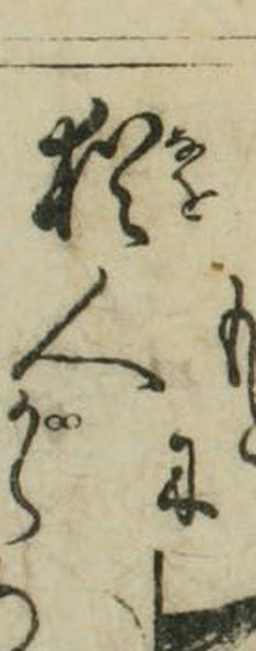猶人がらの
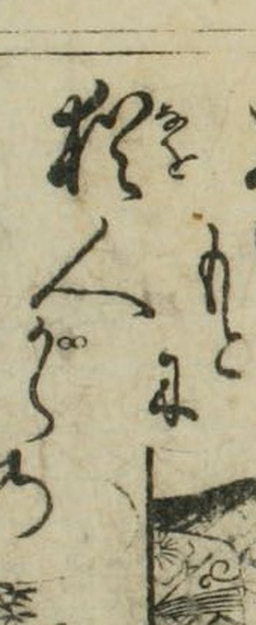猶人がらの
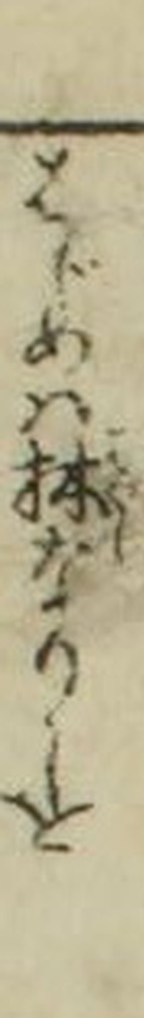はじめは林なりしを
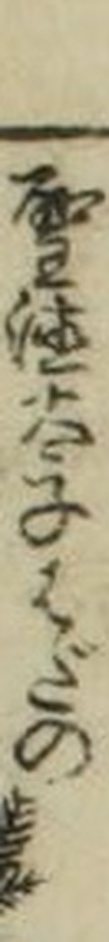聖徳太子はだの
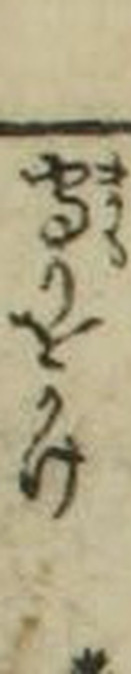守りをかけ
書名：女源氏教訓鑑
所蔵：東京学芸大学附属図書館
